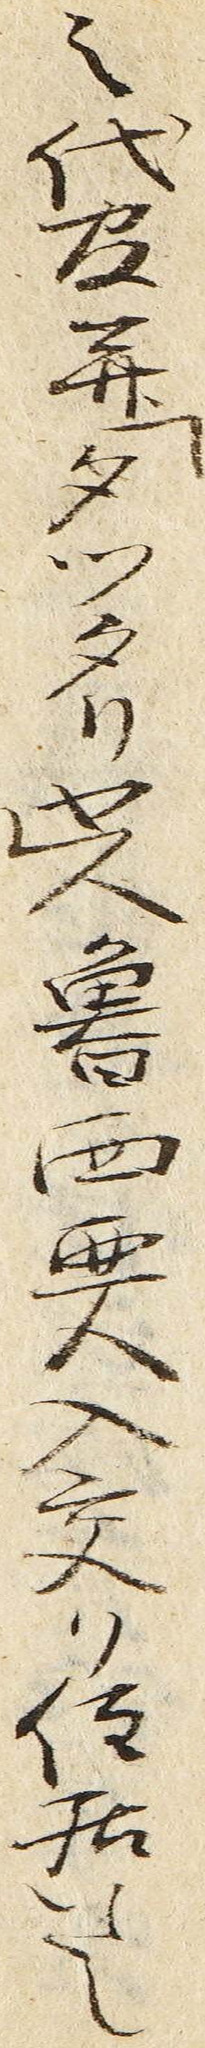之代官并「タツタリヤ」人魯西亜人入交り住居いたし
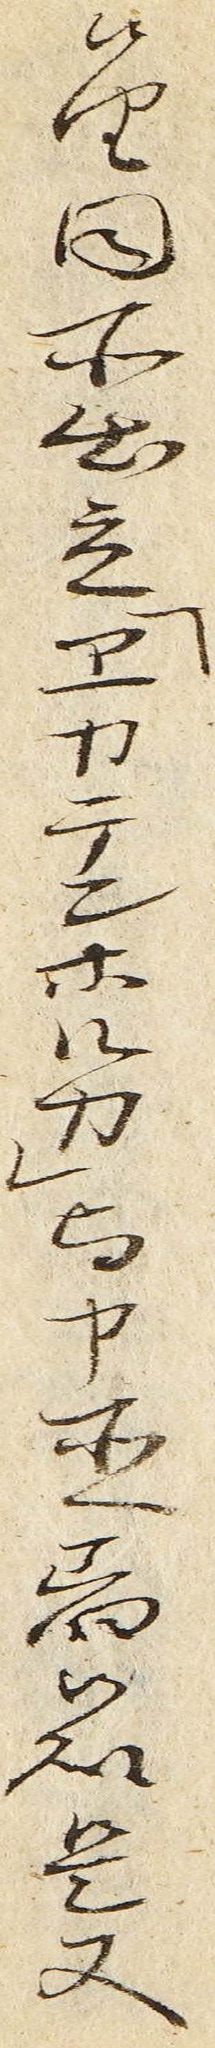候由同所出立「ヱカテンホルカ」と申所へ着候処是又
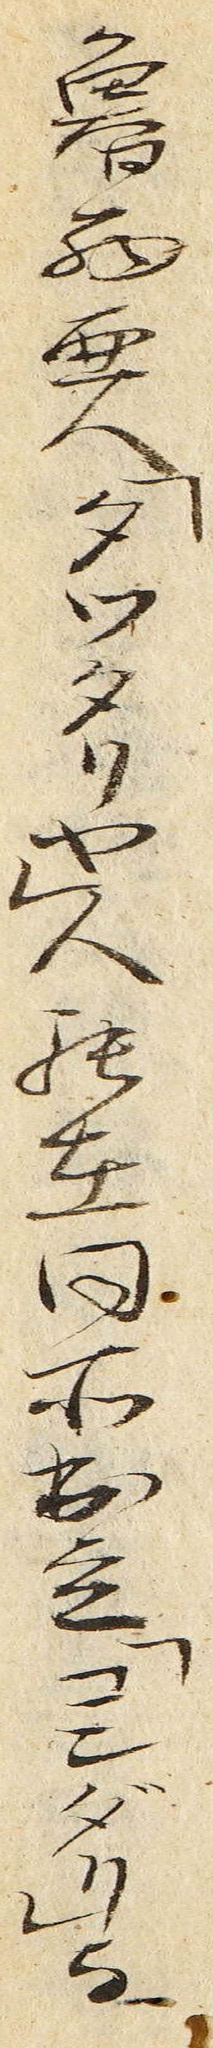魯西亜人「タツタリヤ」人罷在同所出立「コンダリ」と

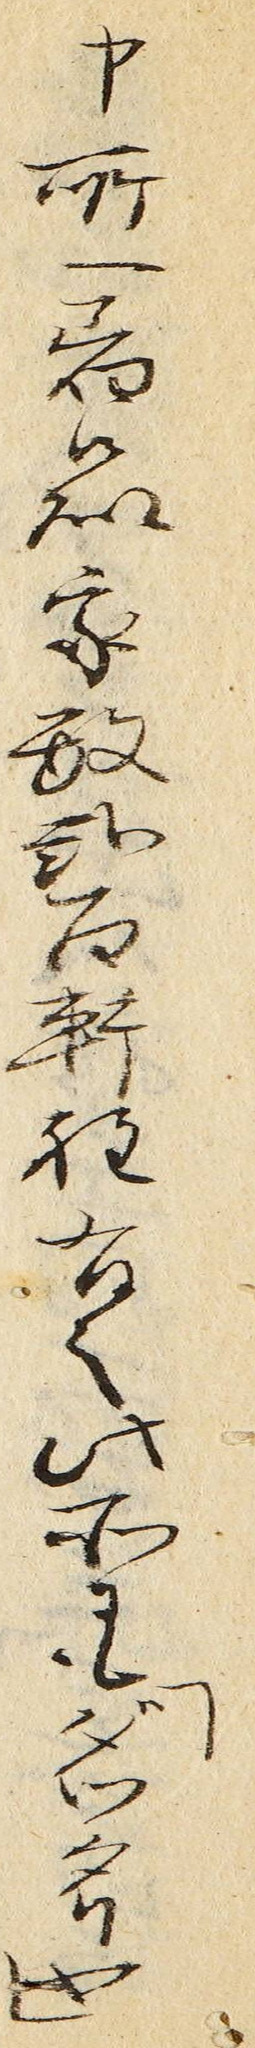申所へ着候処家数弐百軒程有之此所にも「ダツタリヤ」
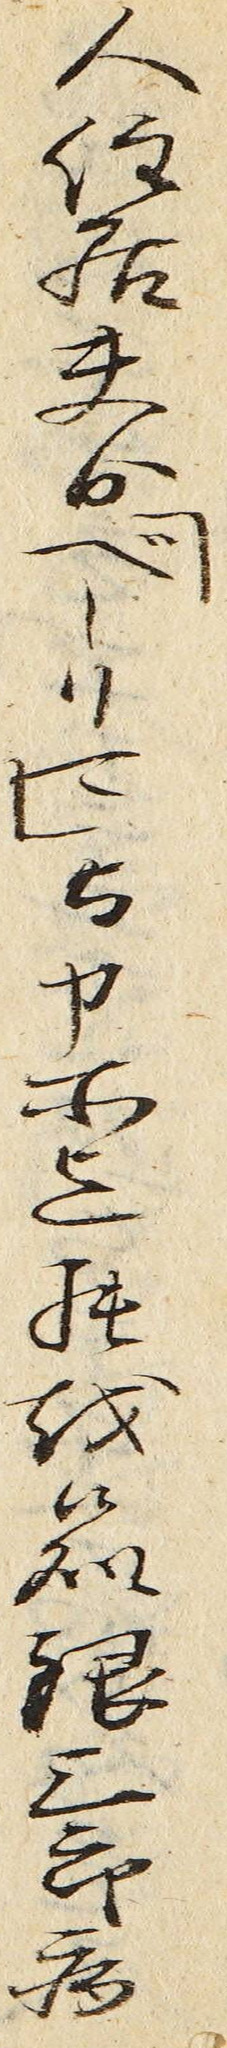人住居夫ゟ「ベーリマ」と申所迄罷越候処銀三郎病
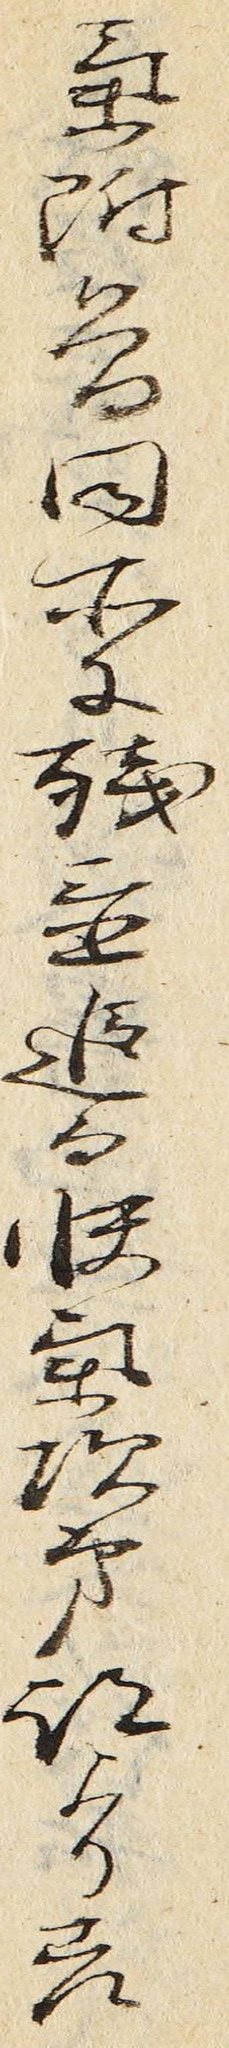気附候間同所に残置追て快気次第跡より差
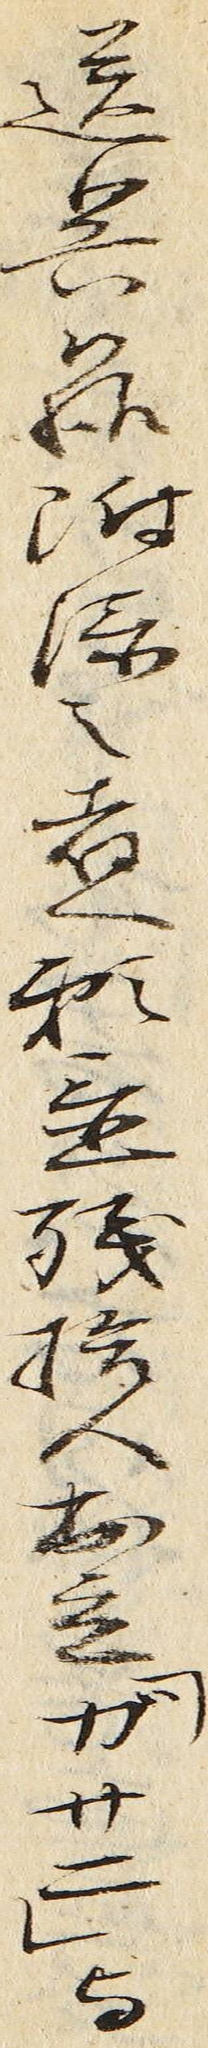送呉候様附添之者へ頼置残拾人出立「ガサニ」と
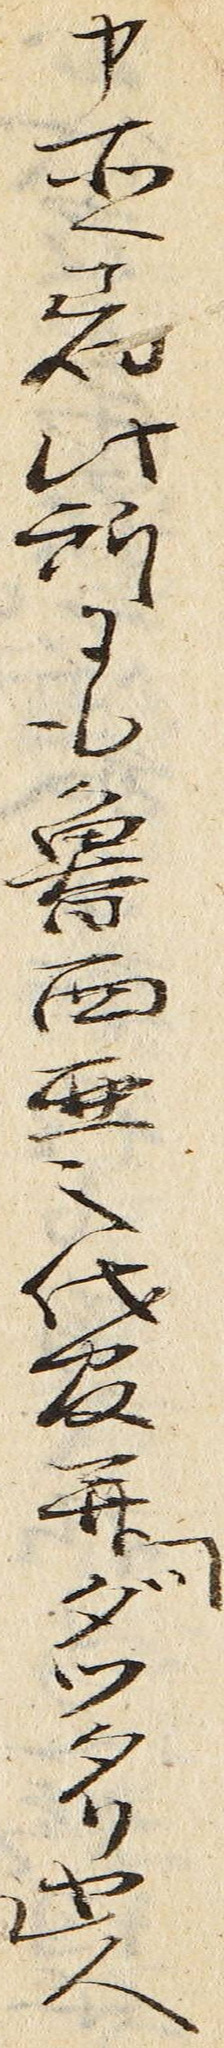申所へ着此所にも魯西亜之代官并「ダツタリヤ」人
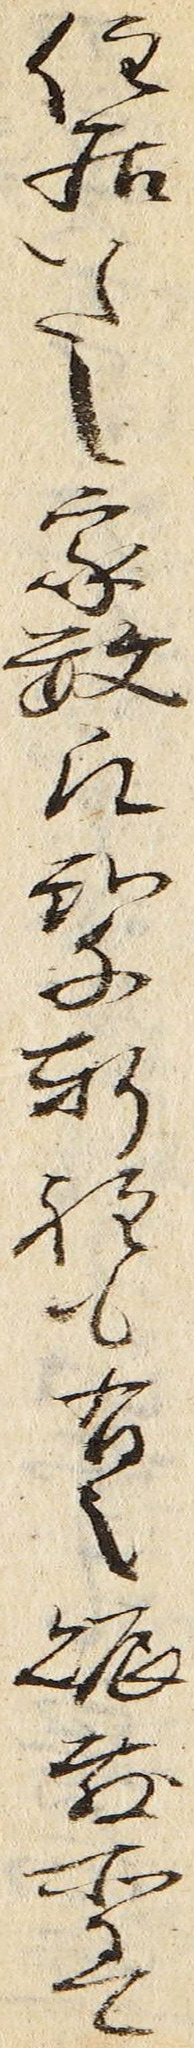住居いたし家数凡弐千軒程も有之賑敷所にて
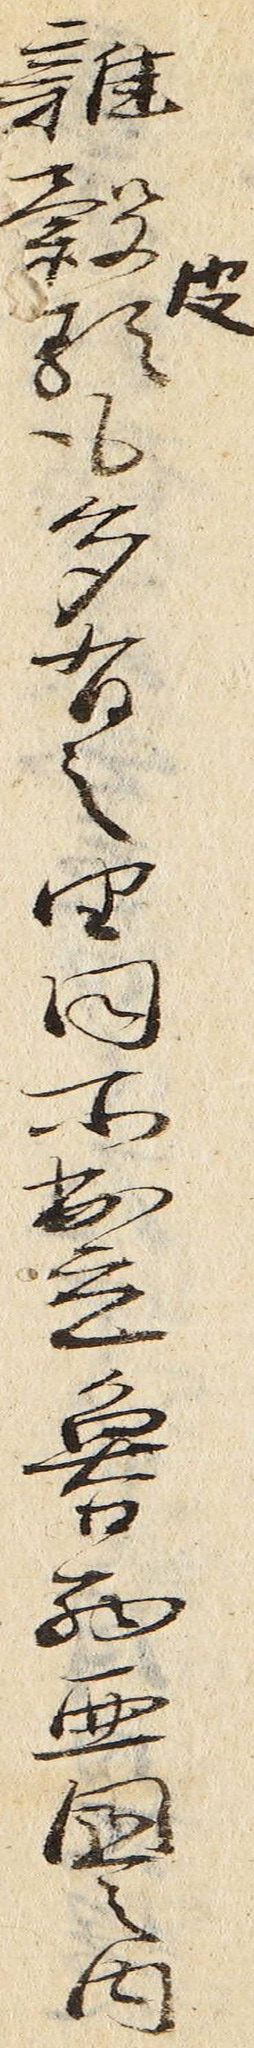雑穀皮類も多有之由同所出立魯西亜国之内
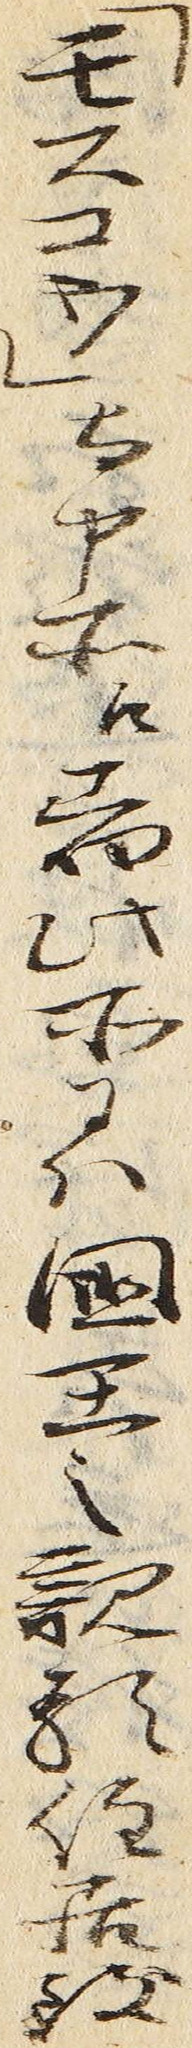「モスコウ」と申所え着此所には国王之親類住居致
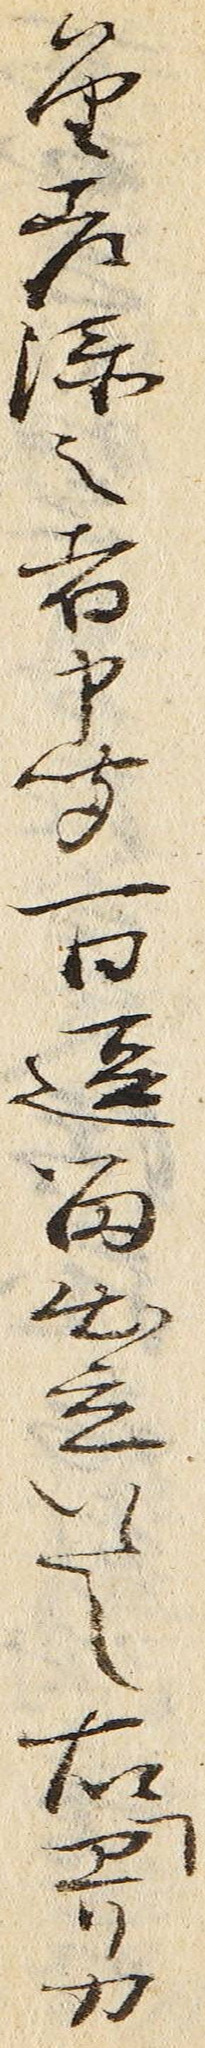候由差添之者申聞一日逗留出立いたし右「ヱリカ
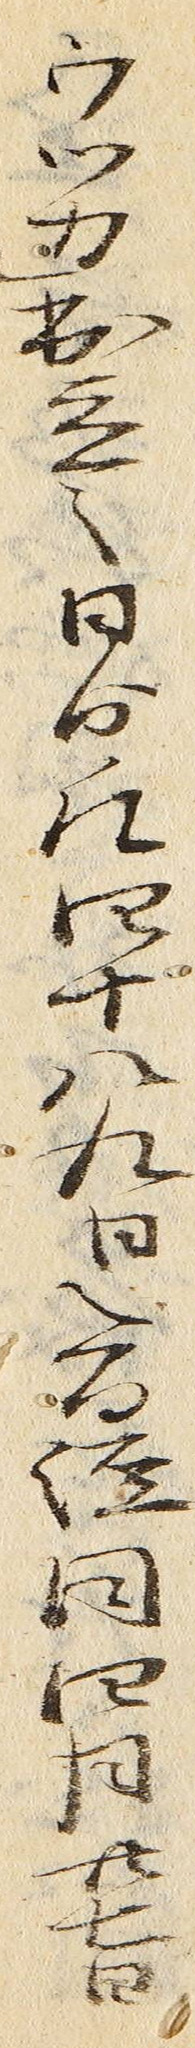ウツカ」出立之日ゟ凡四十八九日之間経同四月廿七日
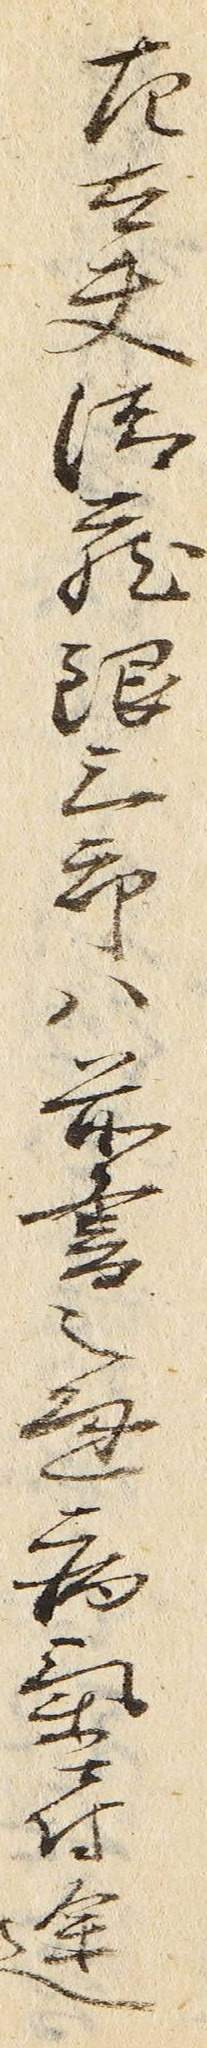左太夫清蔵銀三郎は前書之通病気に付途
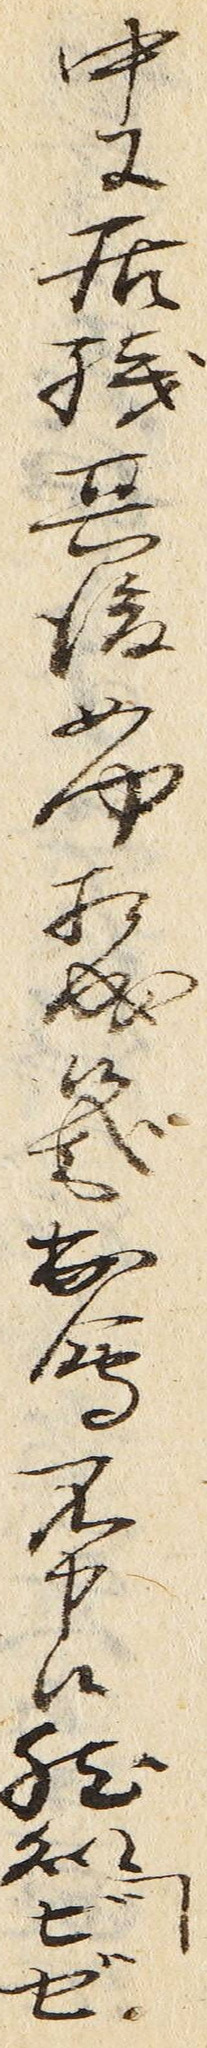中に居残其後如何相成候哉出会不申候然処「ビゼ
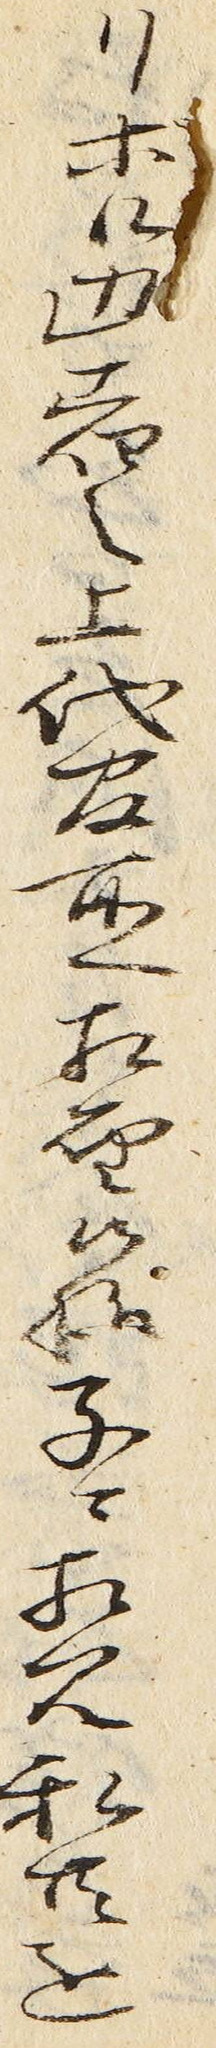リボルカ」着之上代官所へ相届候様子と相見私共を
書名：漂民後記
